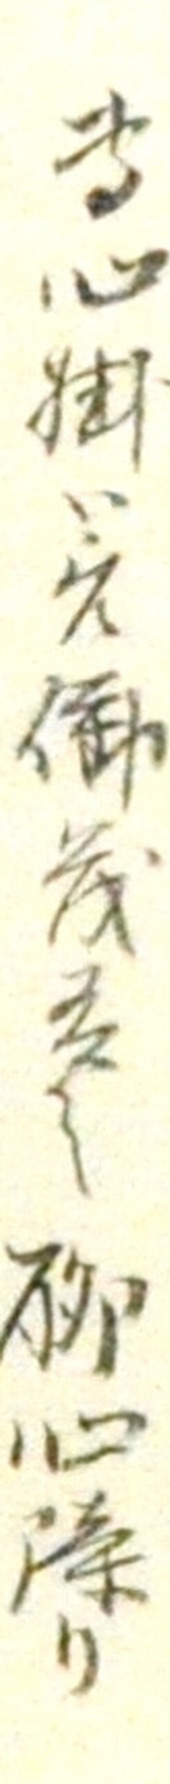専心掛差働も有之聊心障り
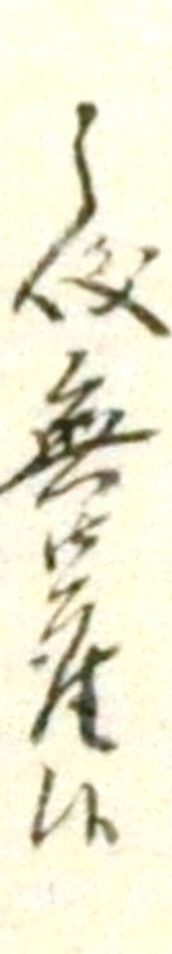之儀無御座候
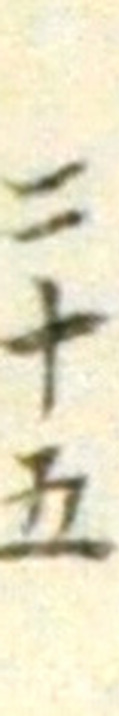二十七

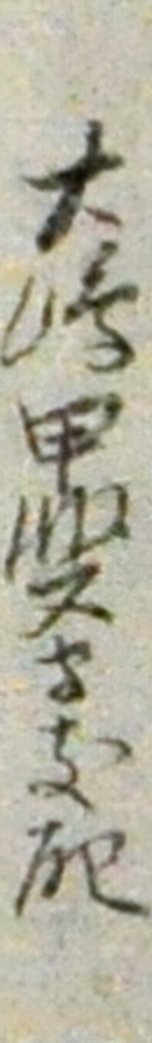大島甲斐守支配
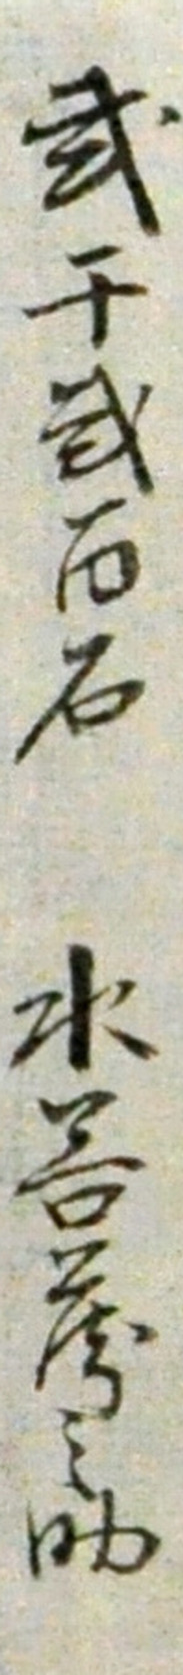弐千弐百石水善蔵之助
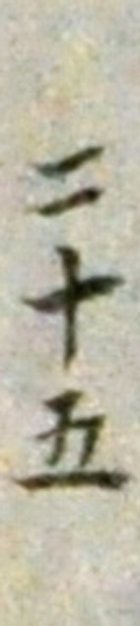二十五
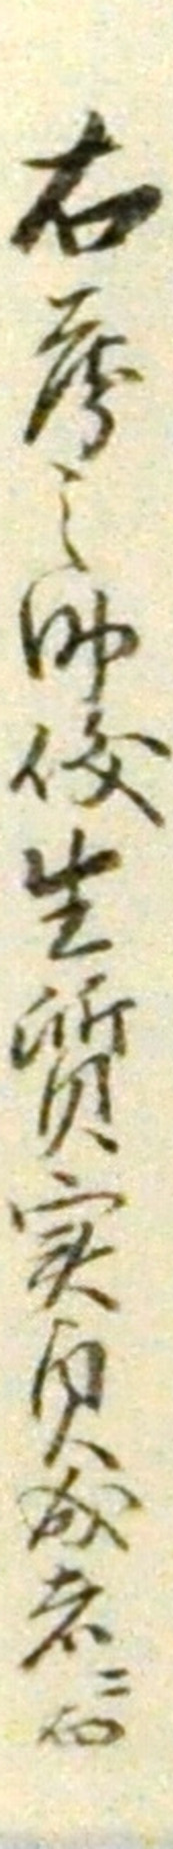右蔵之助儀生質実貞成者にて
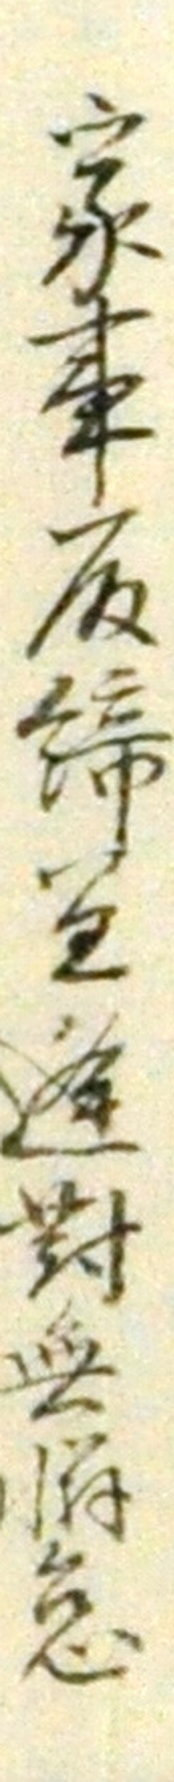家事取締宜逢対無懈怠
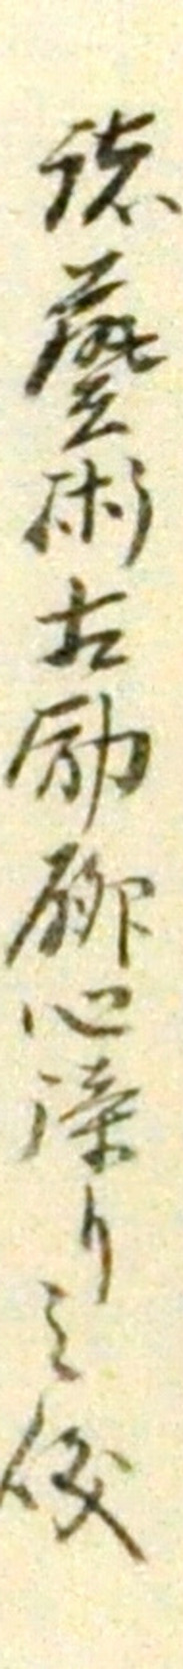諸芸術相励聊心障り之儀
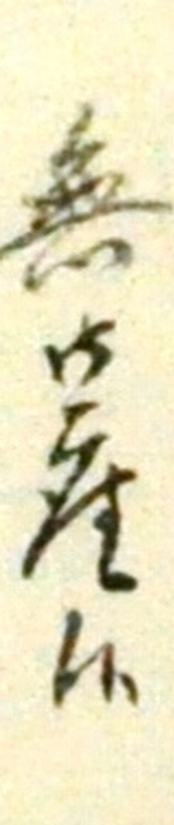無御座候
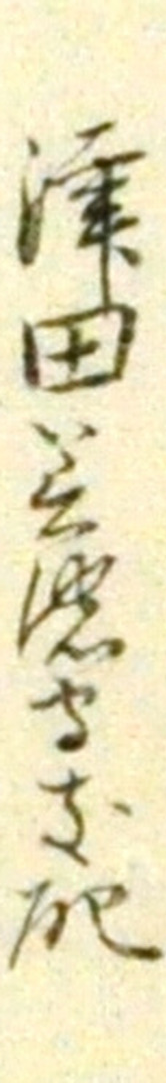津田美濃守支配
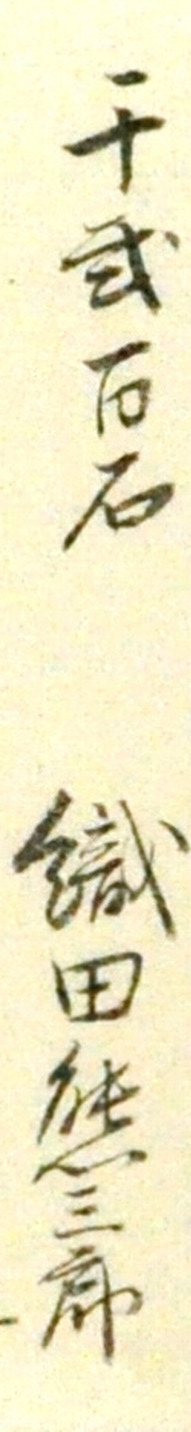千弐百石織田熊三郎
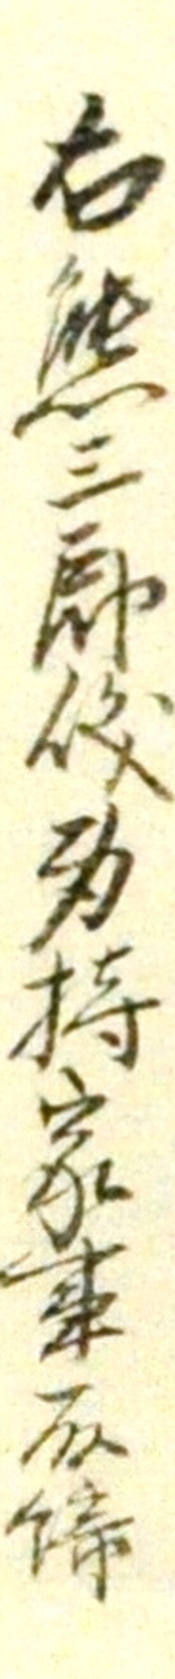右熊三郎儀身持家事取締
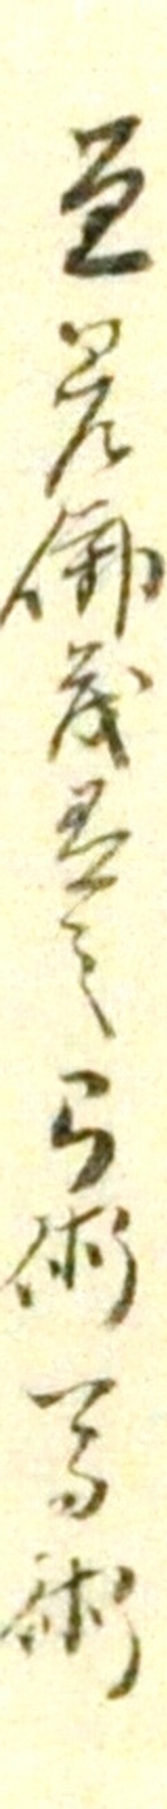宜差働も有之弓術馬術
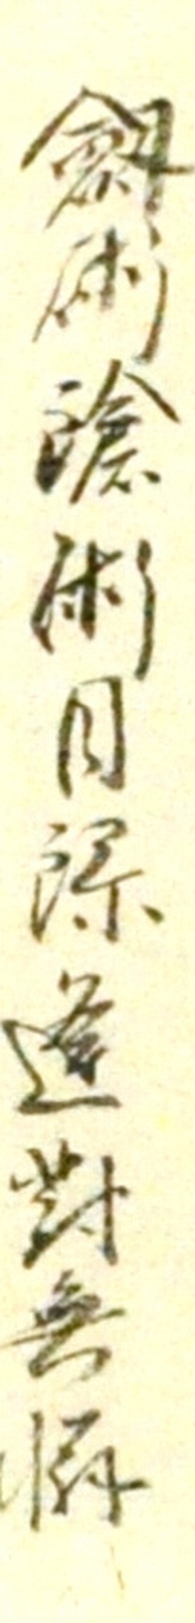剣術鎗術目録逢対無懈
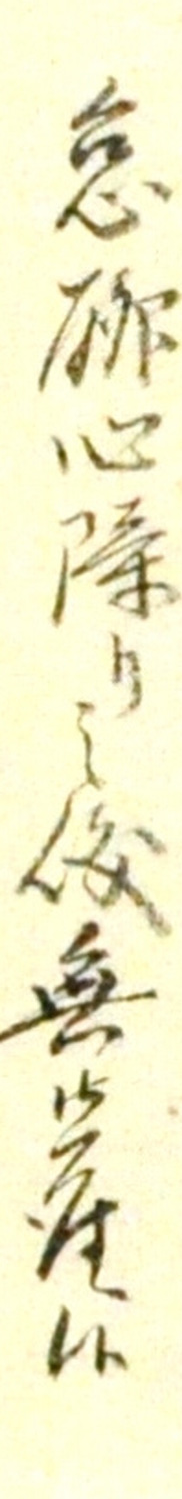怠聊心障り之儀無御座候
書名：下調
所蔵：伊那市立高遠町図書館・合同会社AMANE
